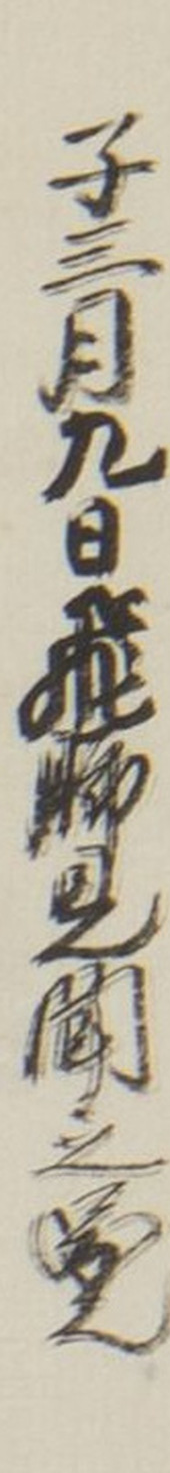子三月九日飛脚見聞之図也
